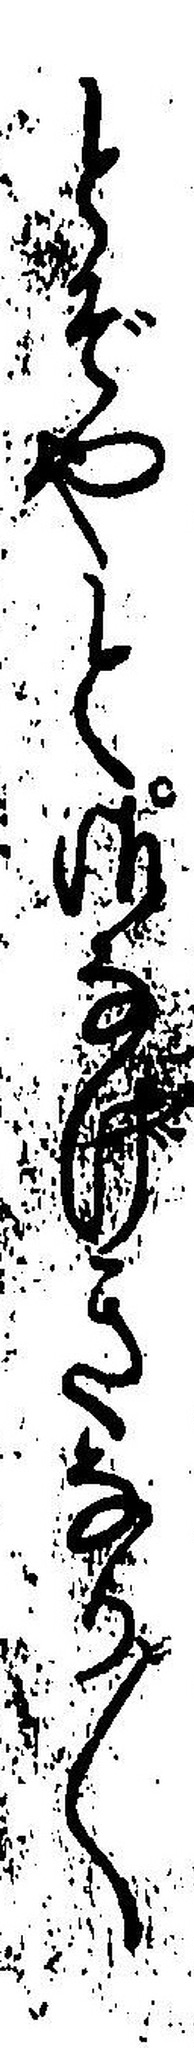とぞやと。御なげきなか〳〵

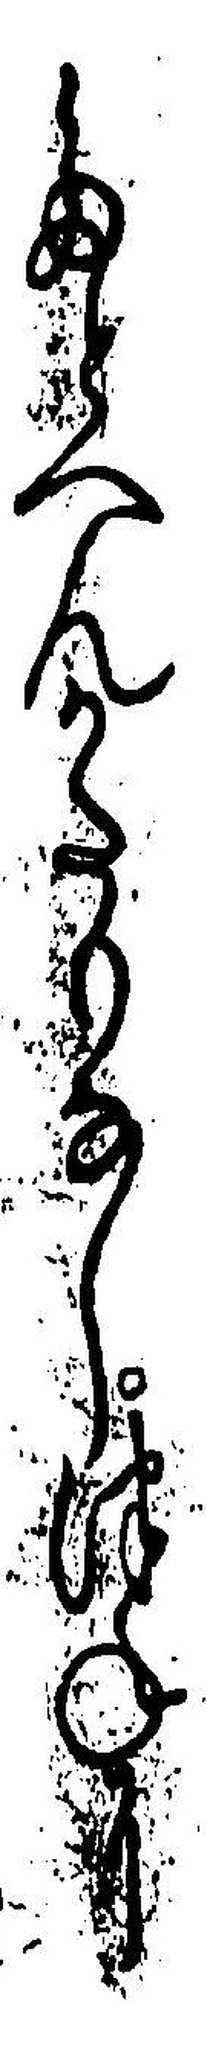たとへんかたもなし。つねに
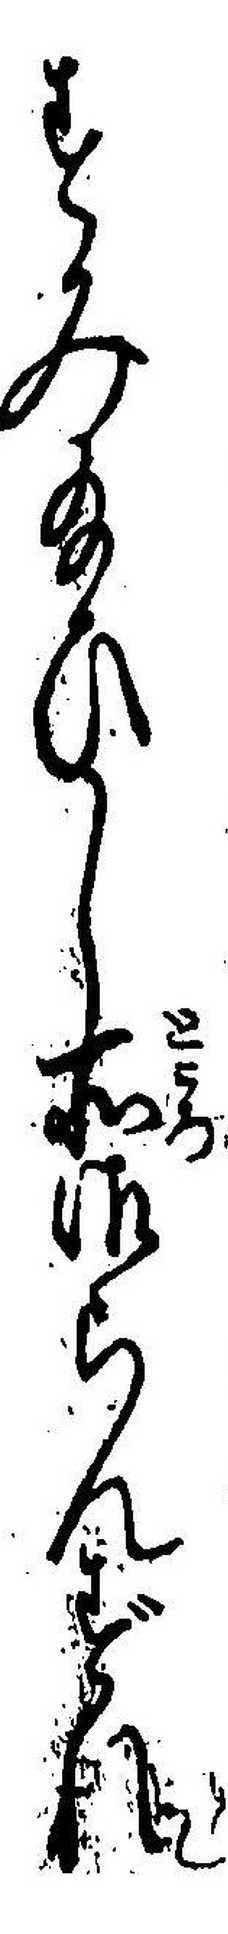すみ給ひし所御らんずれ
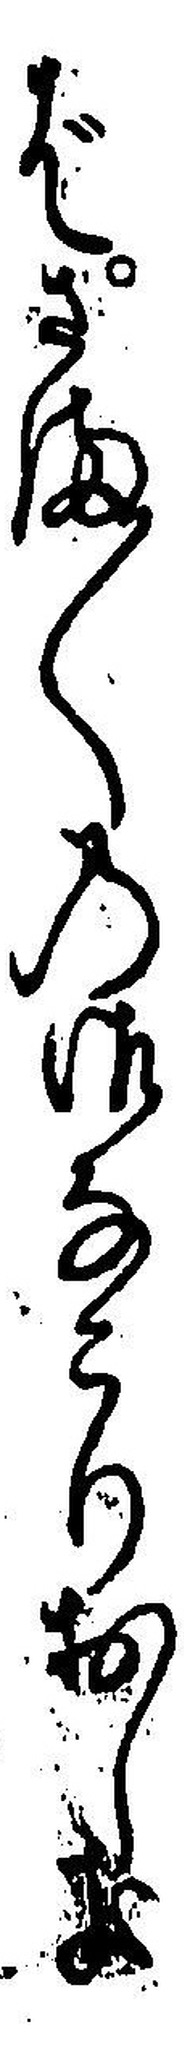ば。さま〳〵の御なこりおしき
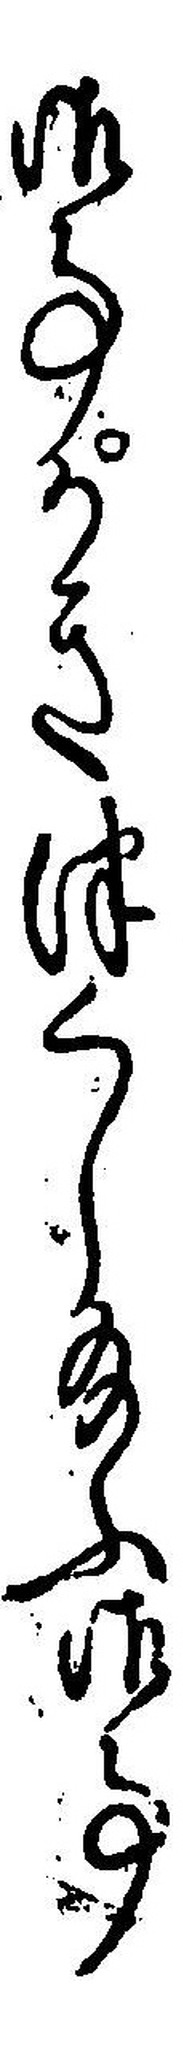御事。かきつくし給ふ御事
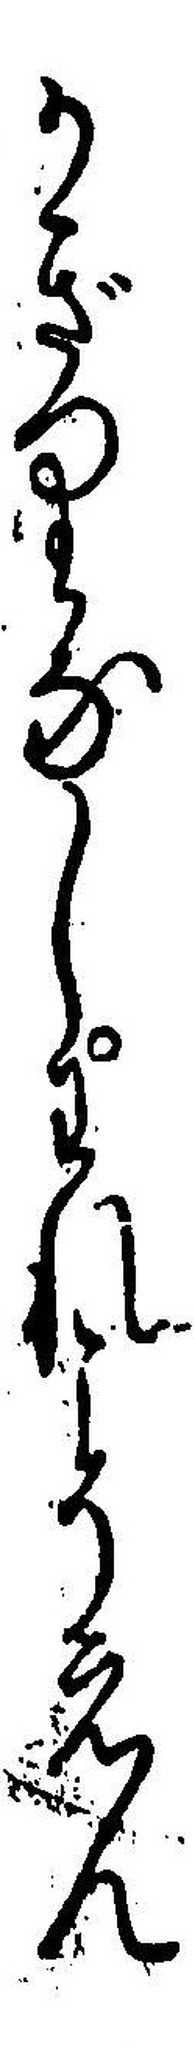かぎりなし。われこそえん
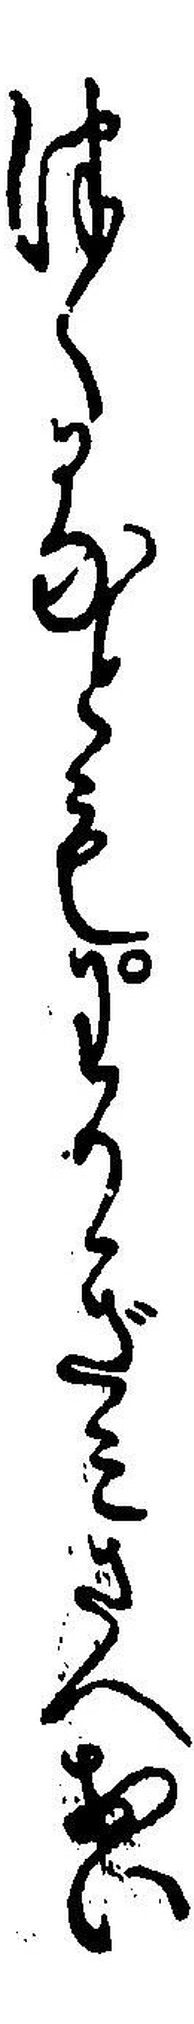つくるとも。わかぎみさへおい
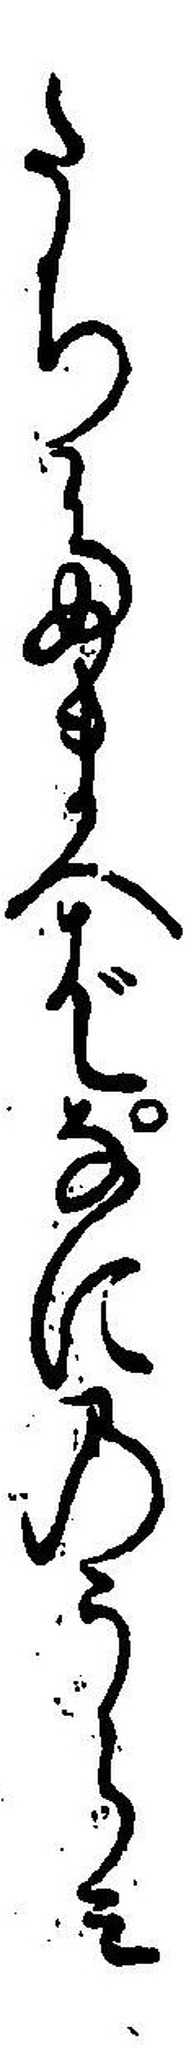たちたまへば。なにのうらみ
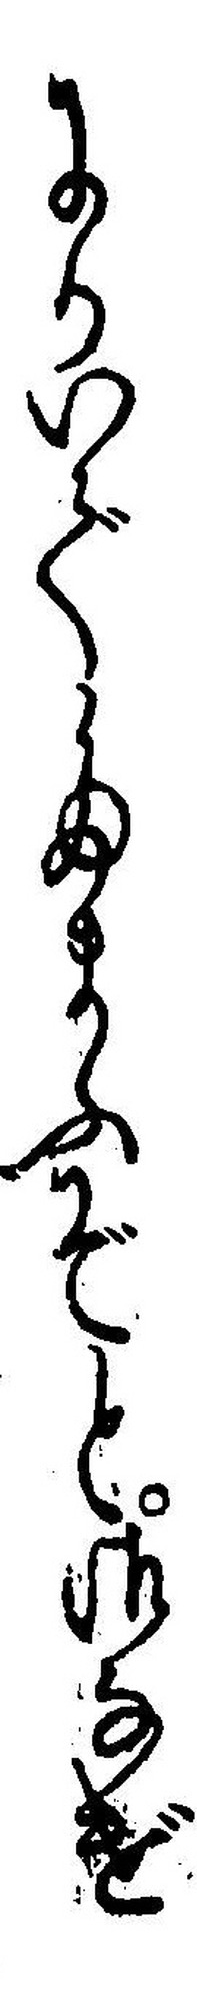にかいでたまふぞと。御なげ
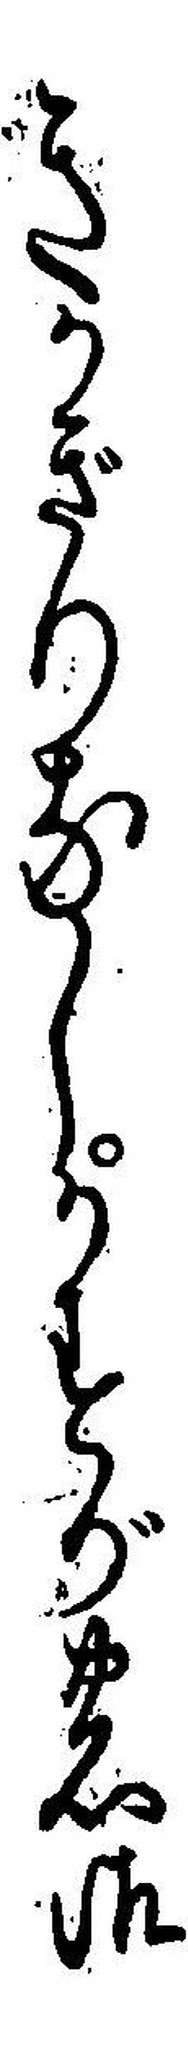きかぎりなし。かすがの御
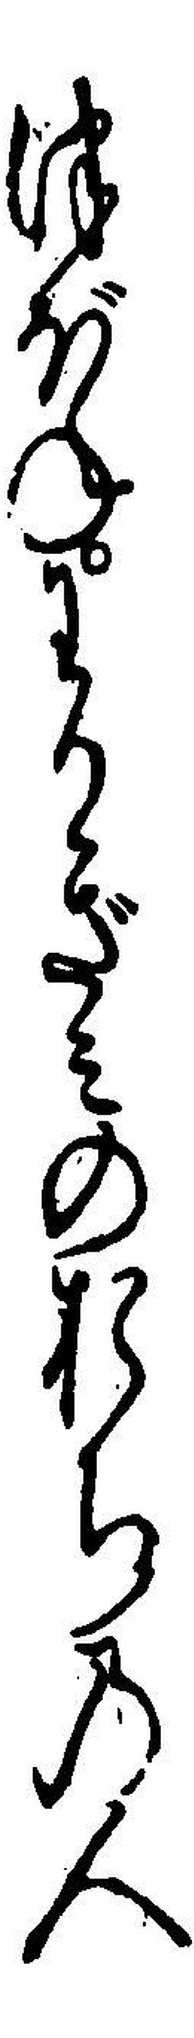つぼね。わかぎみのおちの人
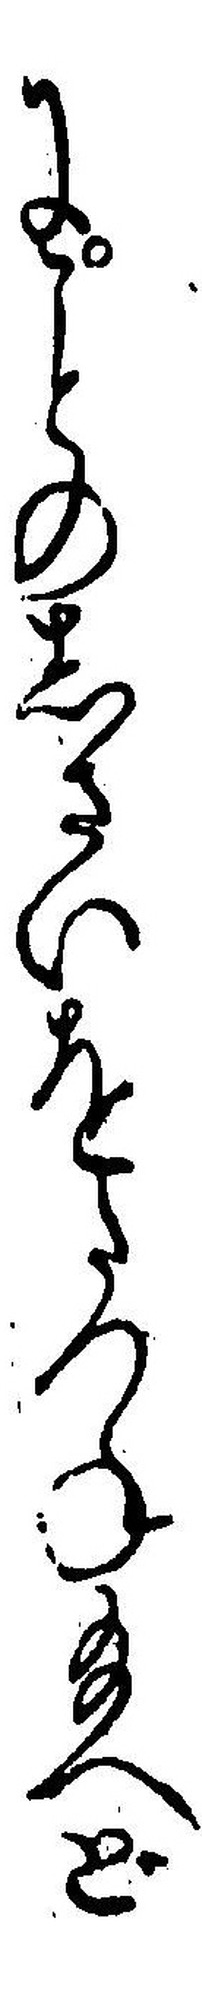に。ことのしさいをたつね給へど
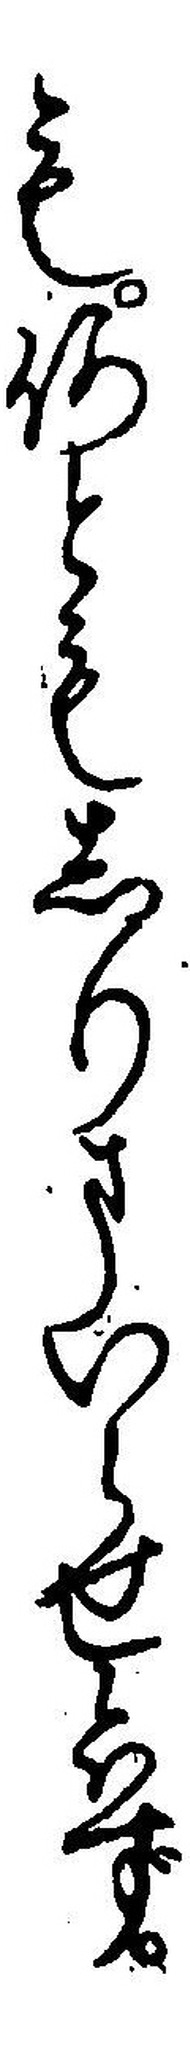も。何ともしりまいらせ候はず。
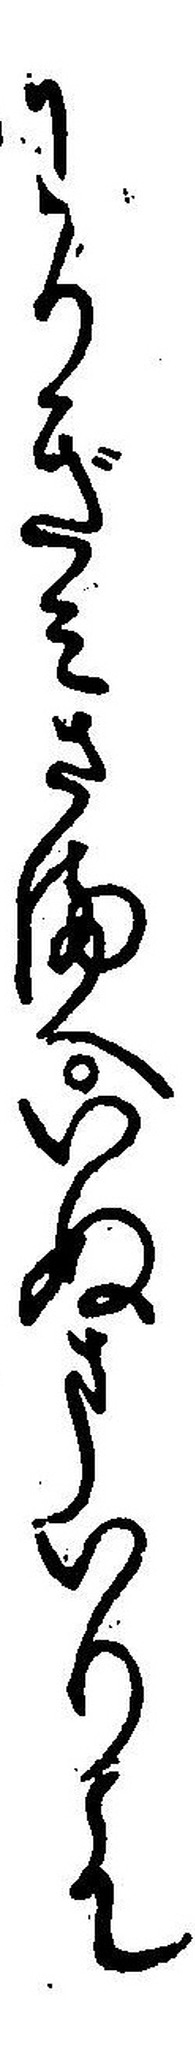わかぎみさまへ。いぬまいり候て
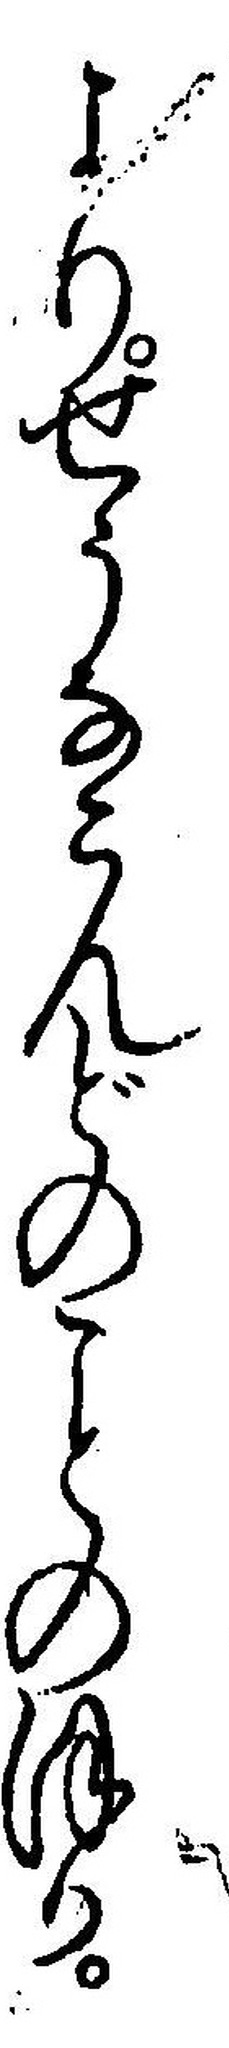より。せうなこんどのことのほか。
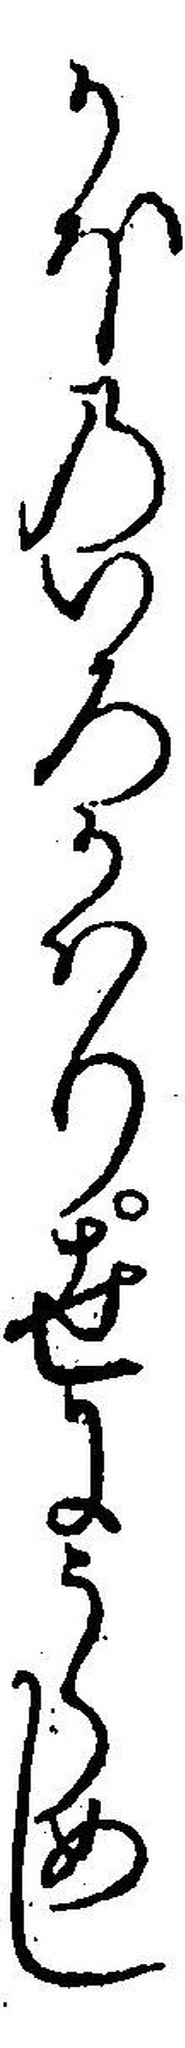かほのいろかはり。世にうらめし
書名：木幡きつね
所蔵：東京大学総合図書館 General Library in the University of Tokyo, JAPAN
